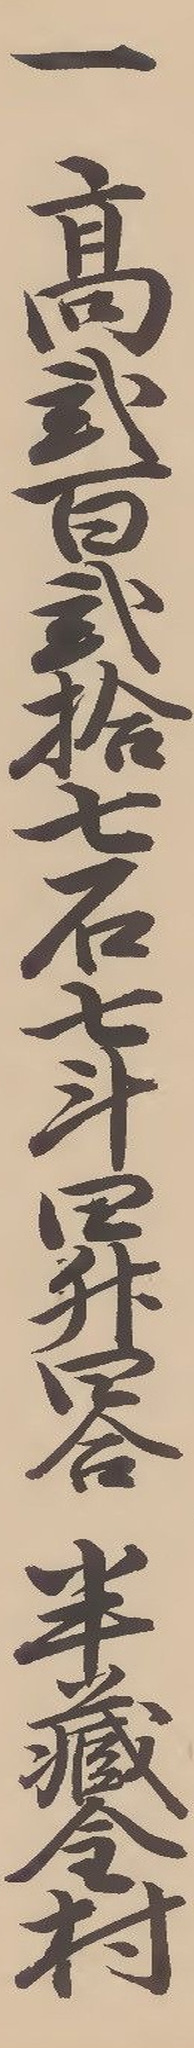一高弐百弐拾七石七斗四升四合半蔵金村
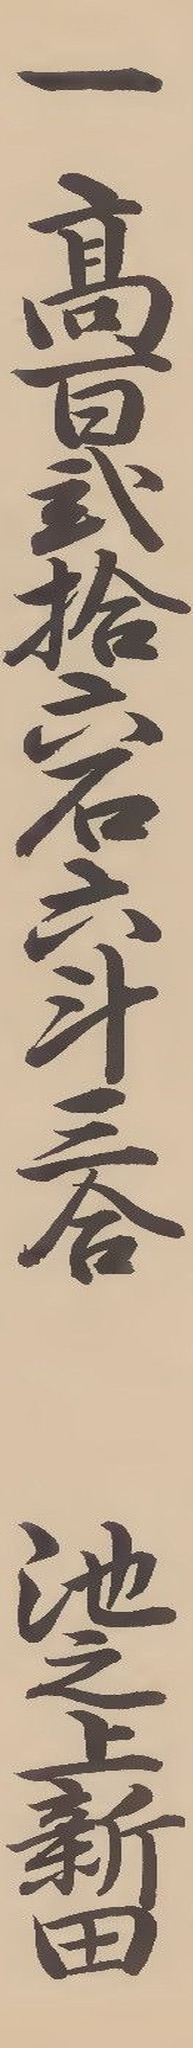一高百弐拾六石六斗三合池之上新田
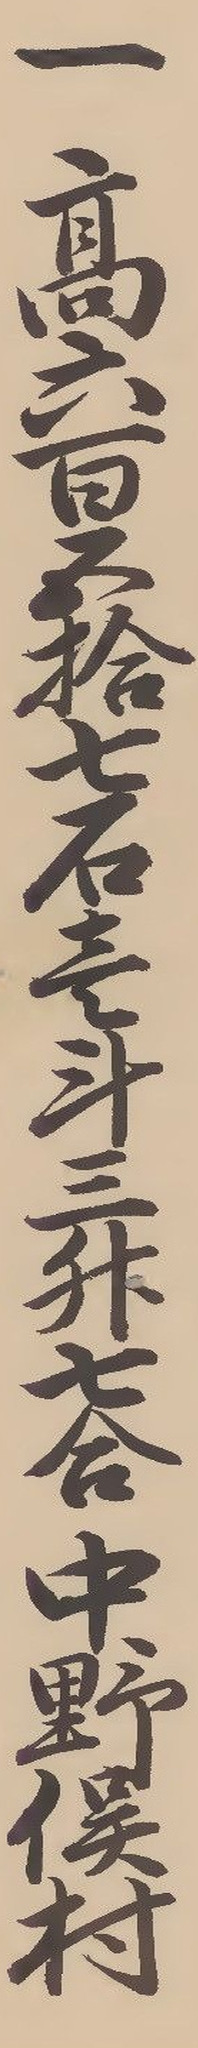一高六百五拾七石壱斗三升七合中野俣村

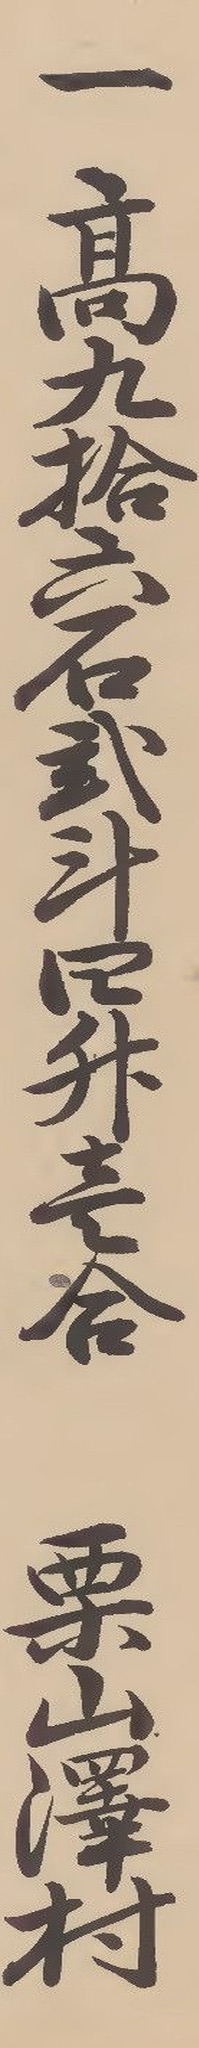一高九拾六石弐斗四升壱合栗山沢村
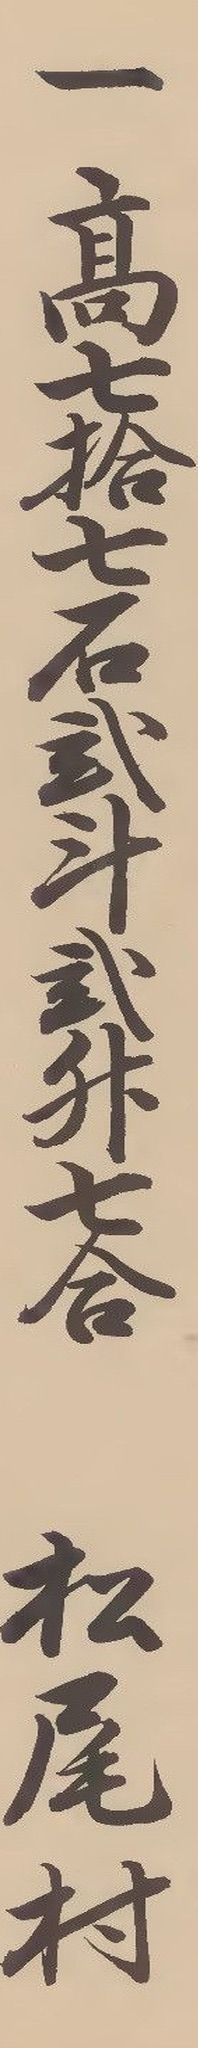一高七拾七石弐斗弐升七合松尾村
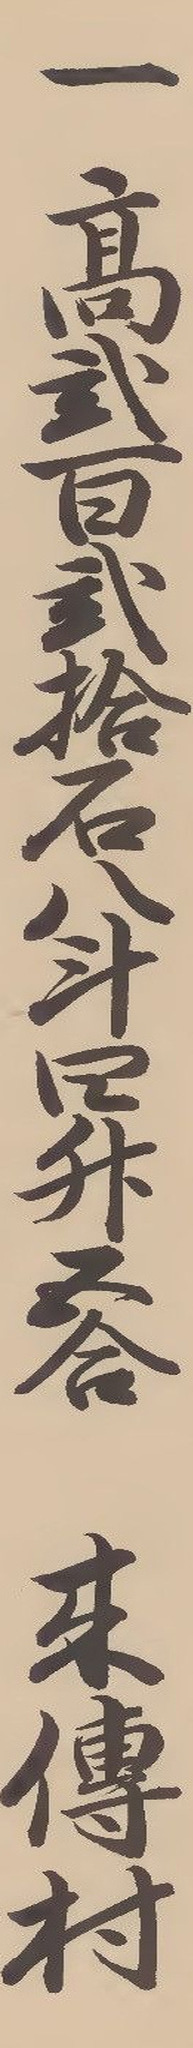一高弐百弐拾石八斗四升五合来伝村
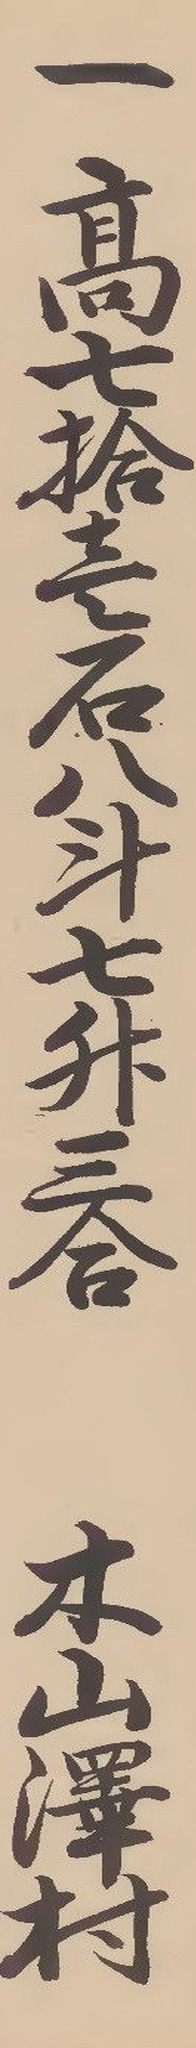一高七拾壱石八斗七升三合木山沢村
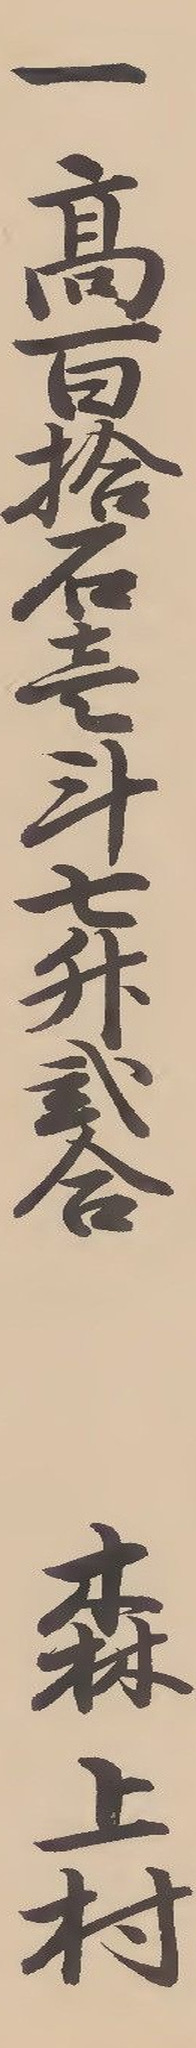一高百拾石壱斗七升弐合森上村
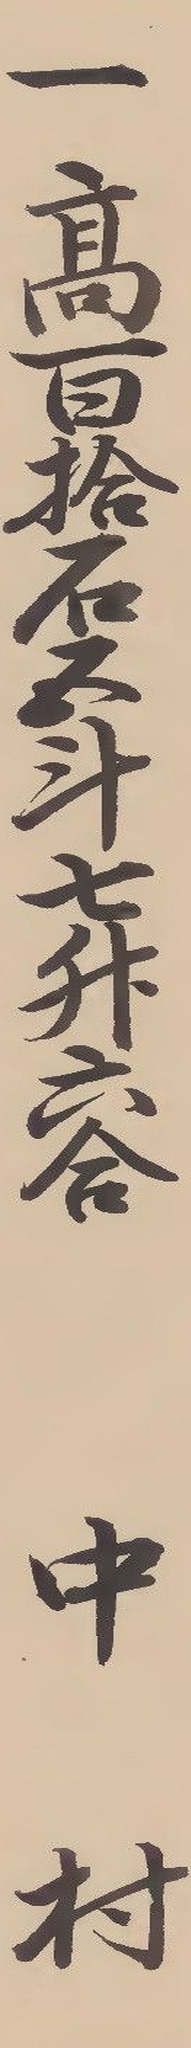一高百拾石五斗七升六合中村
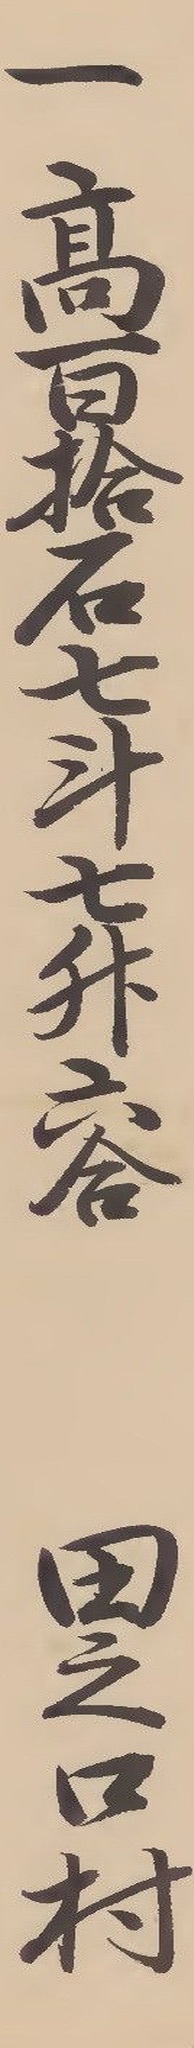一高百拾石七斗七升六合田之口村
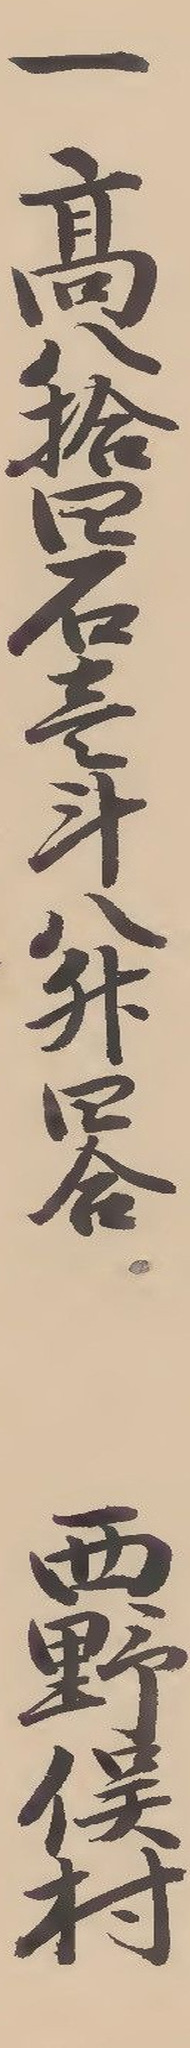一高八拾四石壱斗八升四合西野俣村

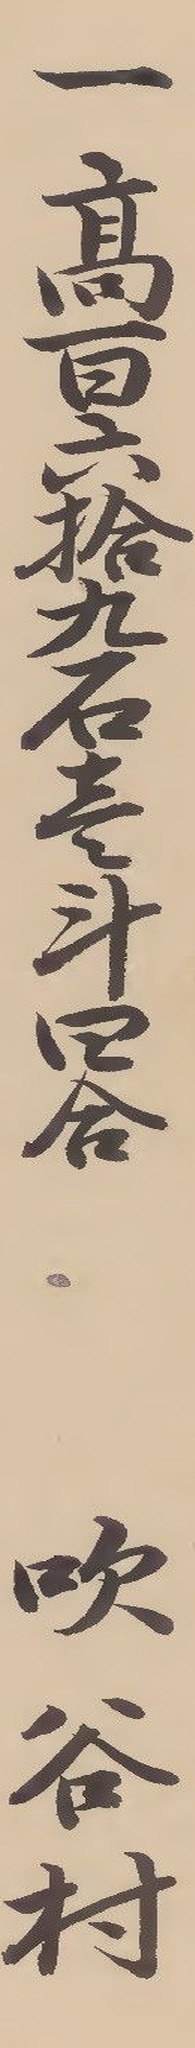一高百六拾九石壱斗四合吹谷村
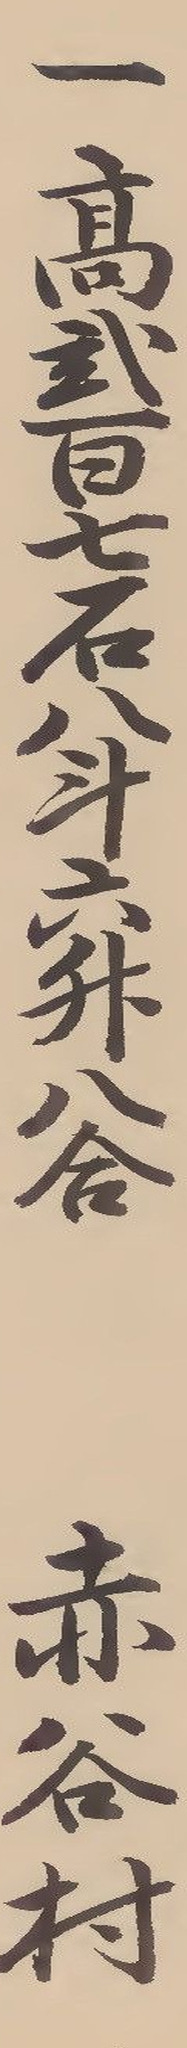一高弐百七石八斗六升八合赤谷村
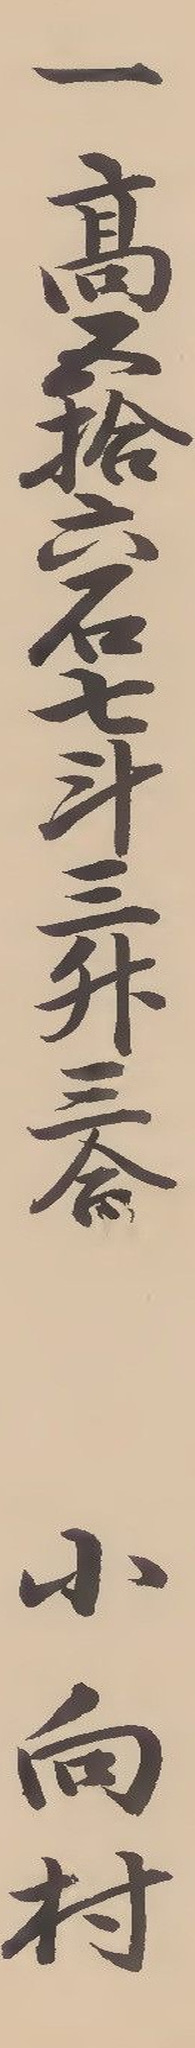一高五拾六石七斗三升三合小向村
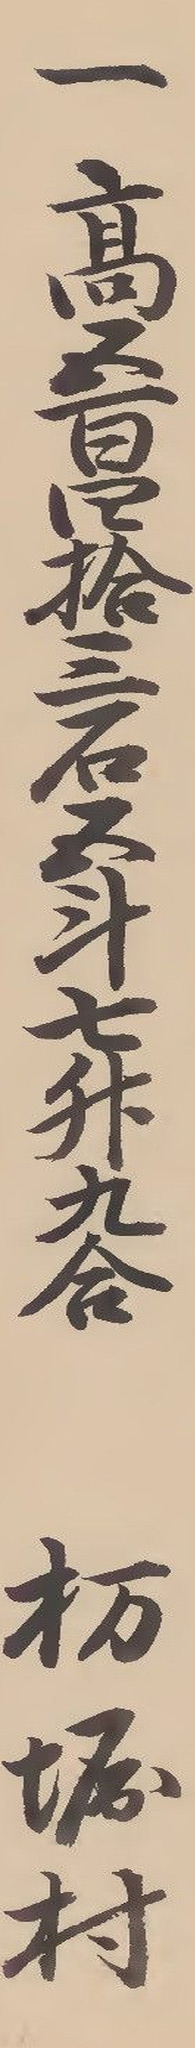一高五百四拾三石五斗七升九合栃堀村
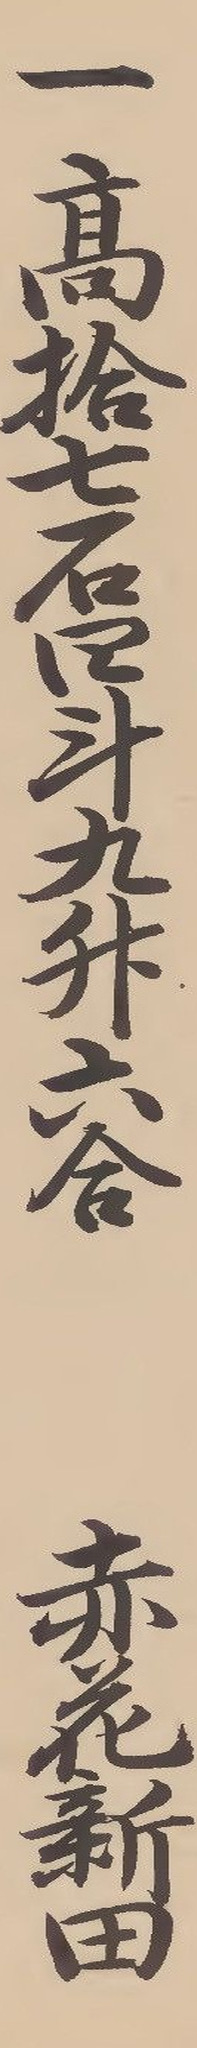一高拾七石四斗九升六合赤花新田
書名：越後国郷帳　中
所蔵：国立公文書館 National Archives of Japan
